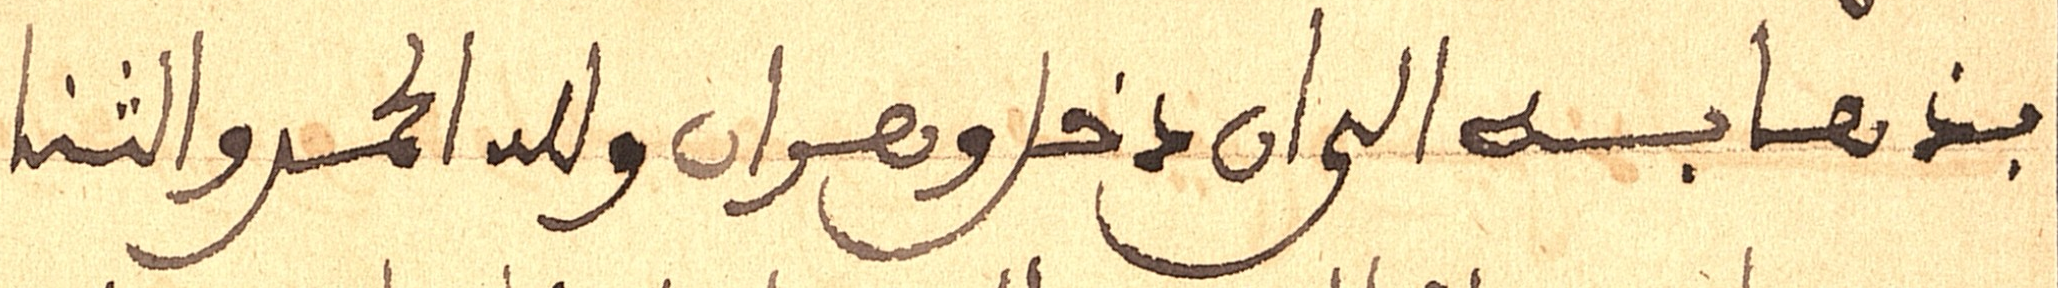بذهابه الى ان دخل وهران ولله الحمد والثنا
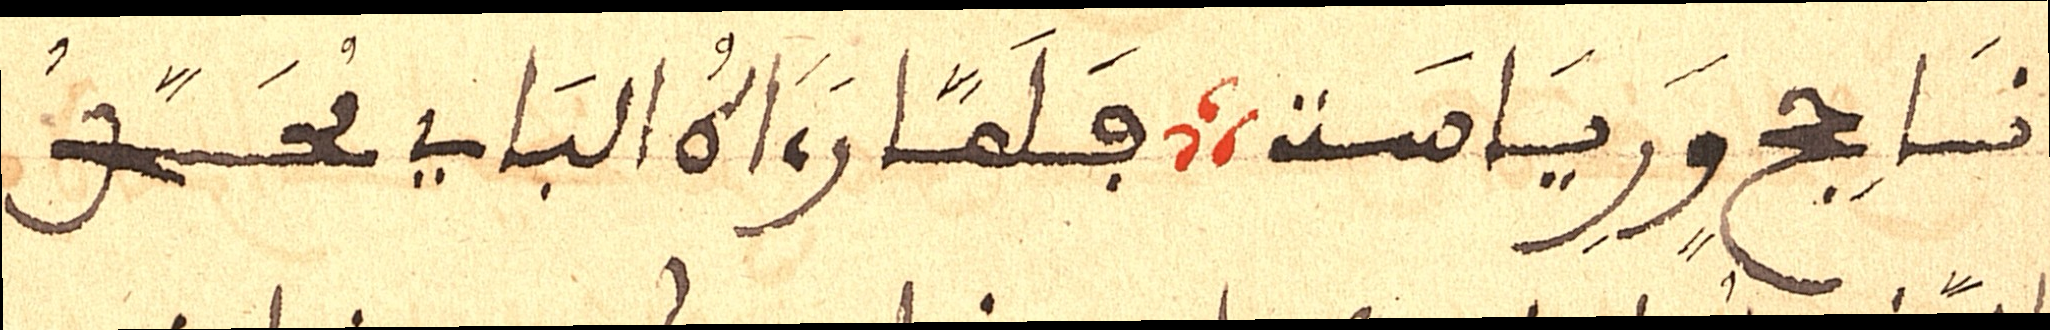ناحج ورياسة فلما رءاه الباي محمد
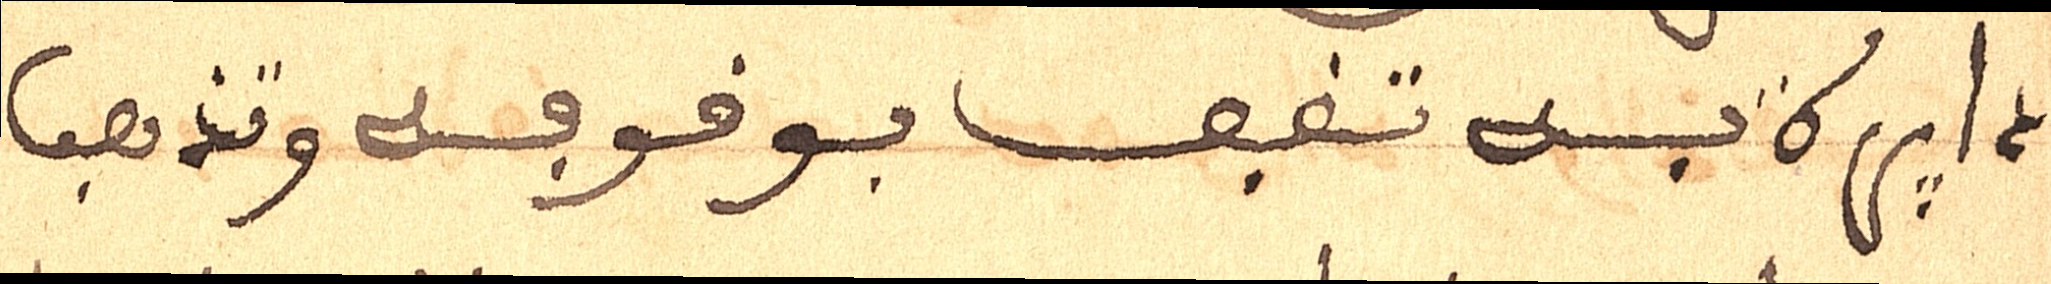دائرة به تقف بوقوفه وتذهب
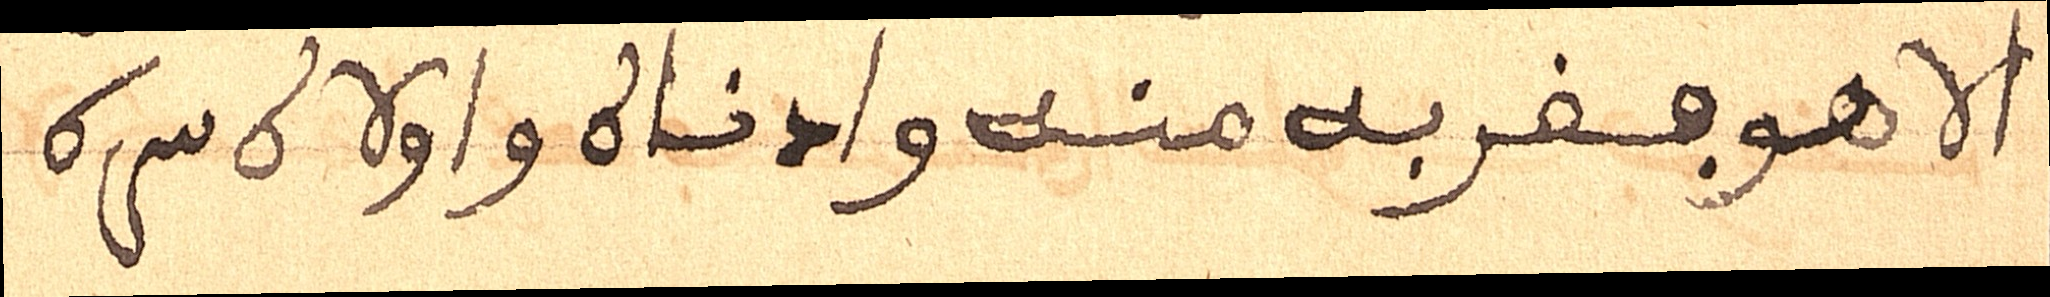الاهو فقربه منه وادناه واولاه سره
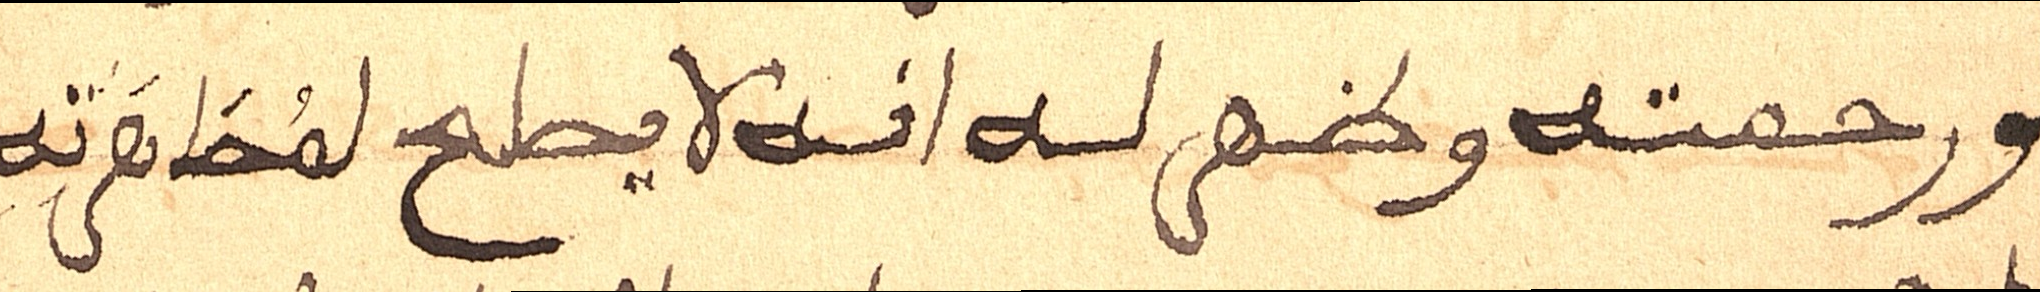ورحمته وظهر له انه لا يصلح لمصاهرته
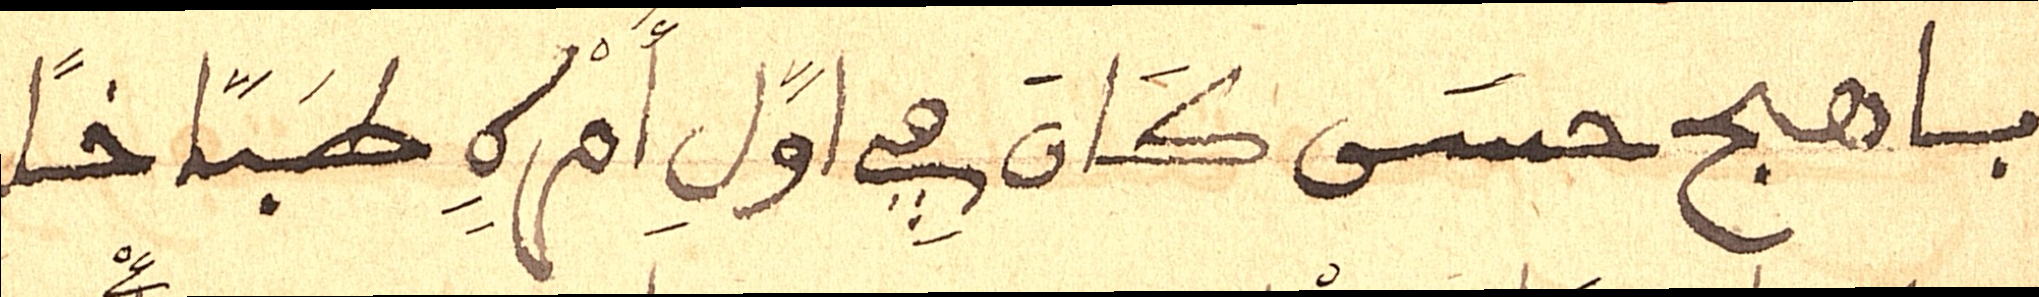باهج حسن كان في اول امره طباخا
